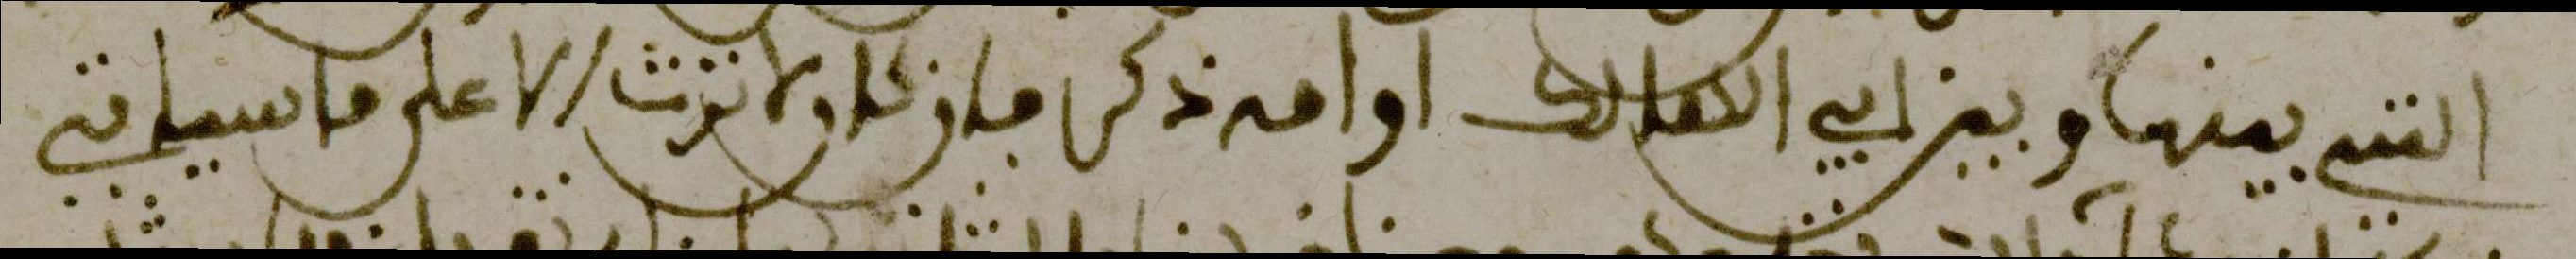التي بينها وبين ابي الهالك او امه ذكر فان كان لا ترث الا على ماسياتي
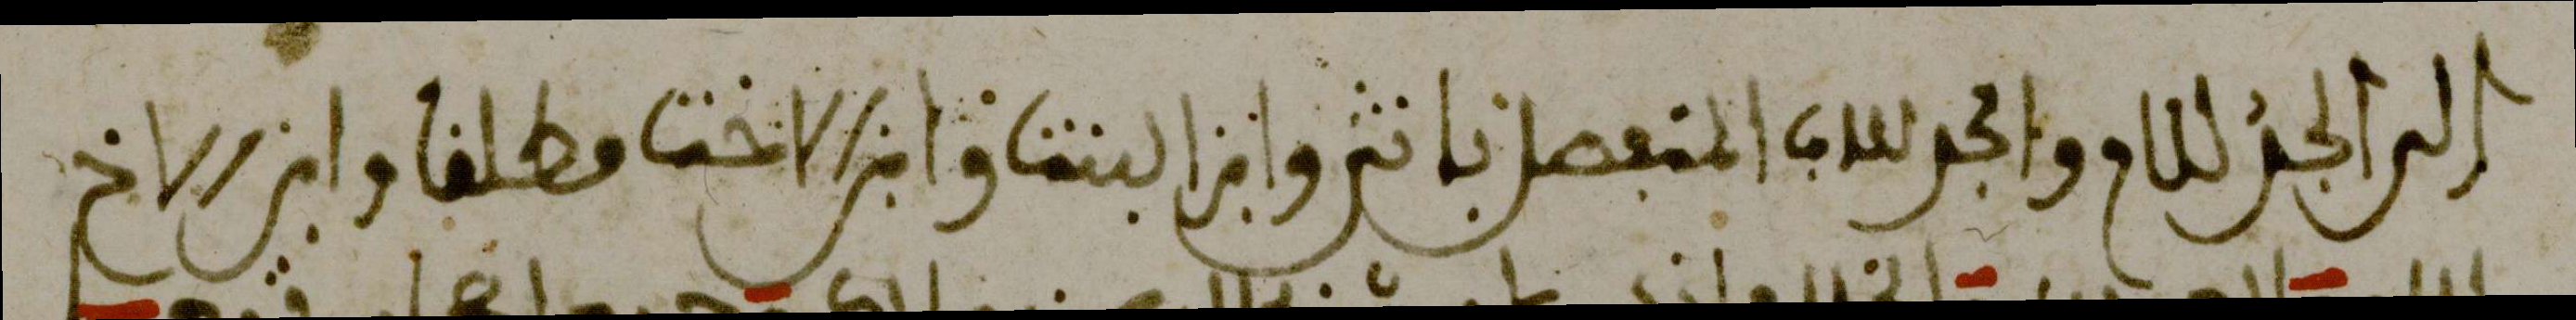الى الجد للام والجد للاب المنفصل بانثى وابن البنت وابن الاخت مطلقا وابن الاخ
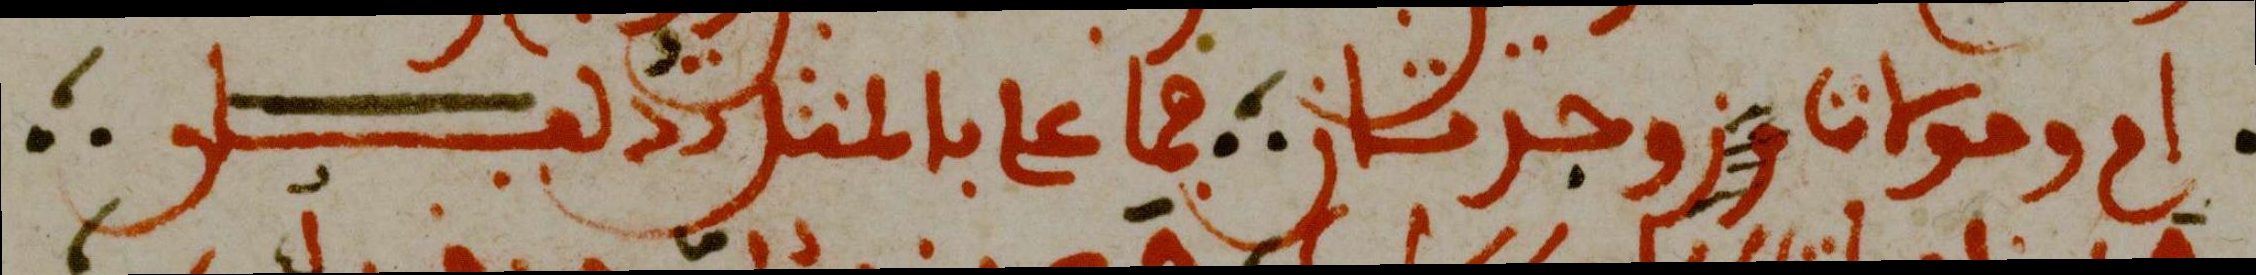ام ومولات وزو جدتان فما على بالمثل تدليان
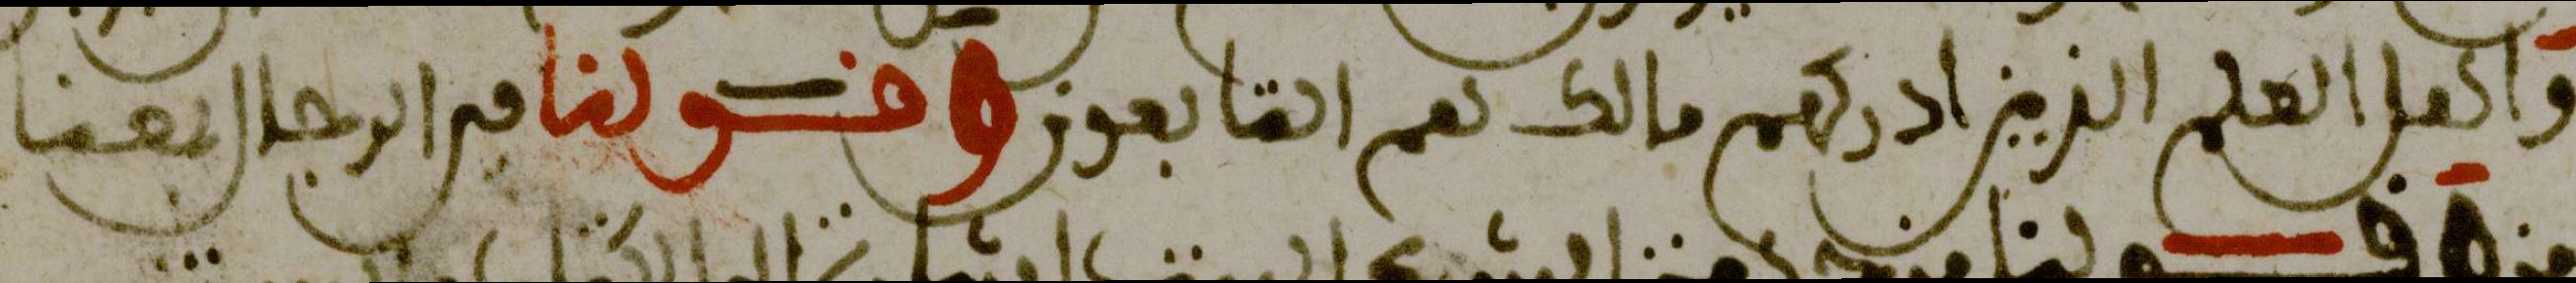وَاهل العلم الذين ادركهم مالك هم التابعون وَقَولنا في الرجال بمعنا
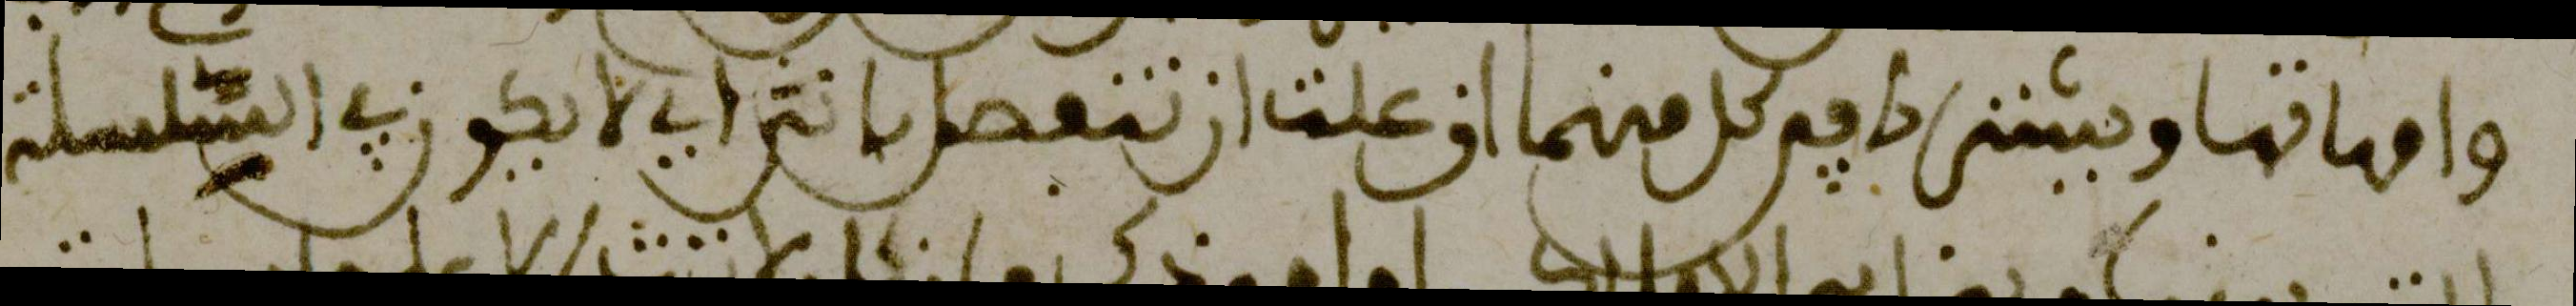وامهاتها ويشترط في كل منهما ان علت ان تنفصل بانثى اي لا يكون في السّلسلة
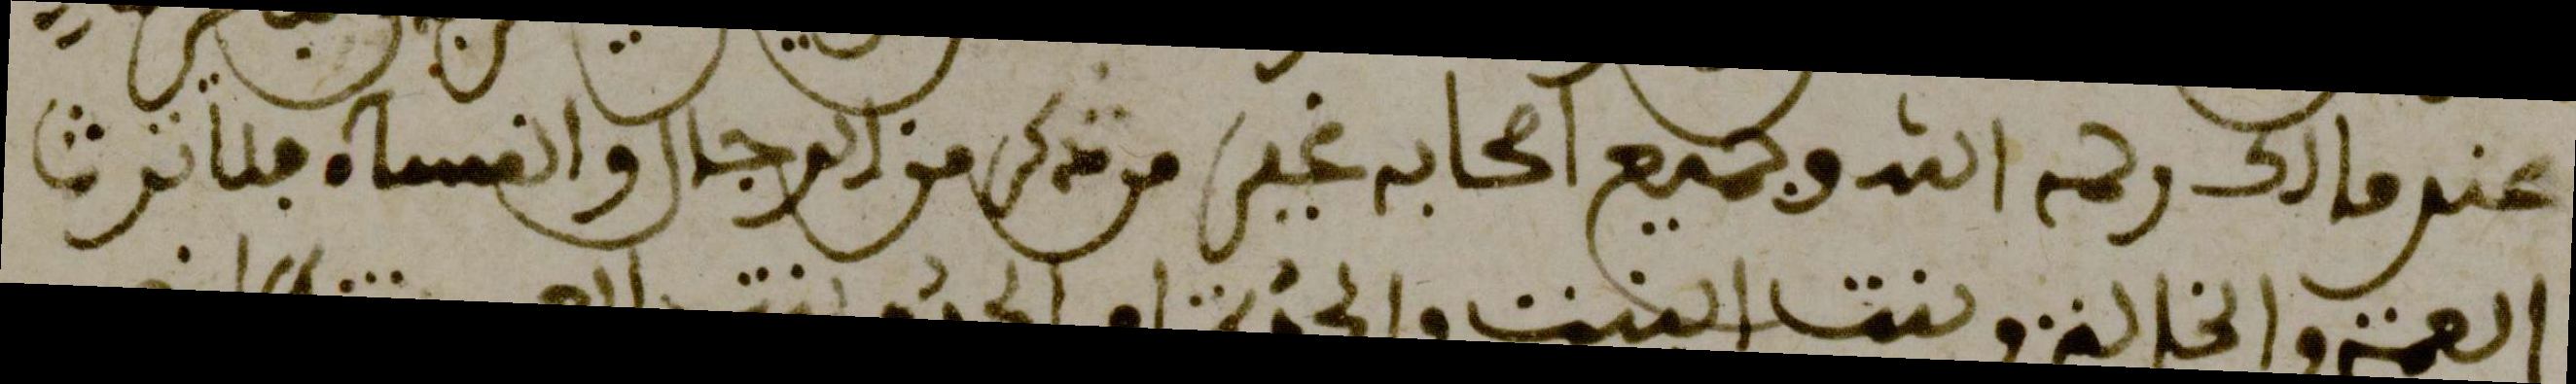عند مالك رحمه الله وجميع اصحابه غير من ذكر من الرجال والنساء فلا ترث
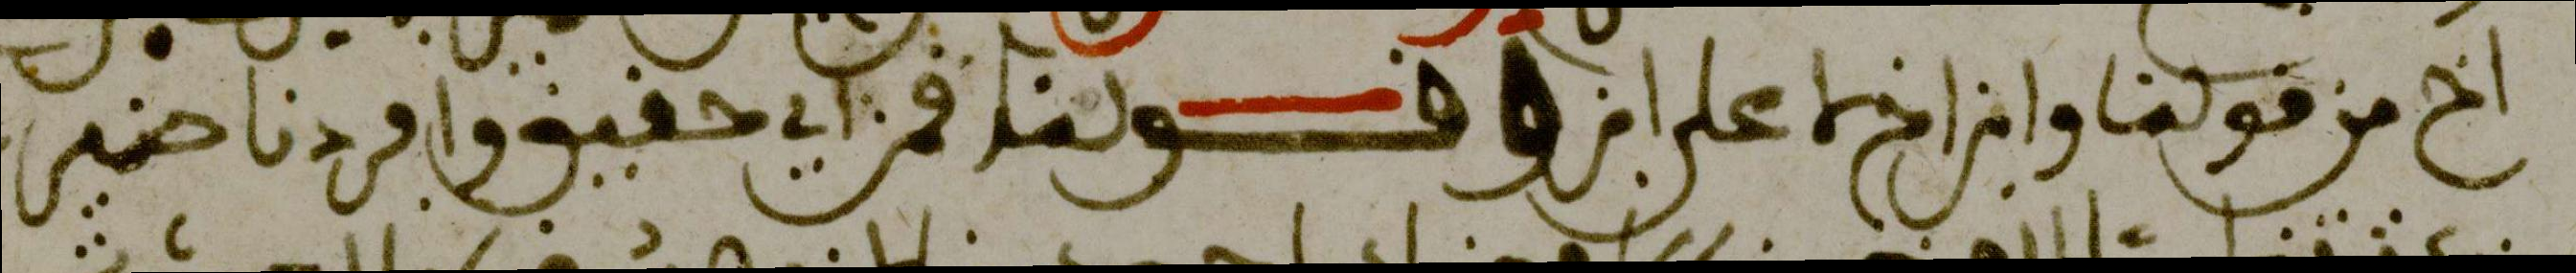اخ من قولنا وابن اخ لا على ابن وَقَولنا قن اي حقيق وافردنا ضمير
